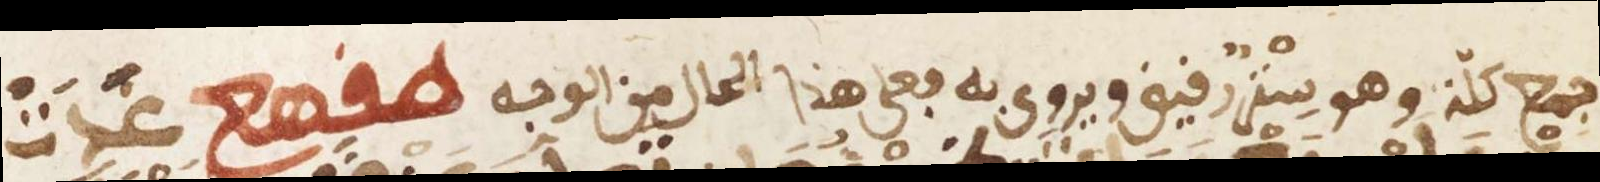جمع كلة و هو ستر رقيق و يروى به فعلى هذا الحال من الوجه طقهع غدت
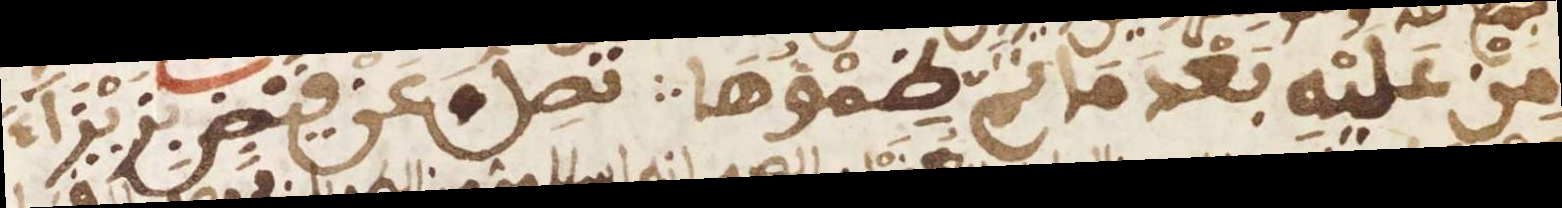من عليه بعد ما تم ظمؤها تصل عَن قيض بزيزآء
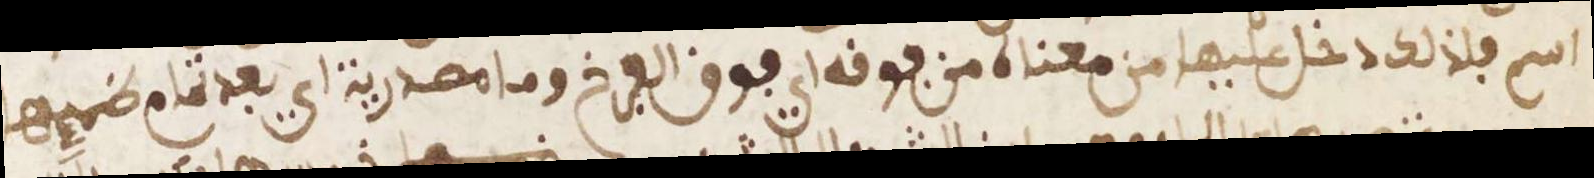اسم فلذلك دخل عليها من معناه من فوقه اي فوق الفرخ و ما مصدرية اي بعد تمام ظمئها
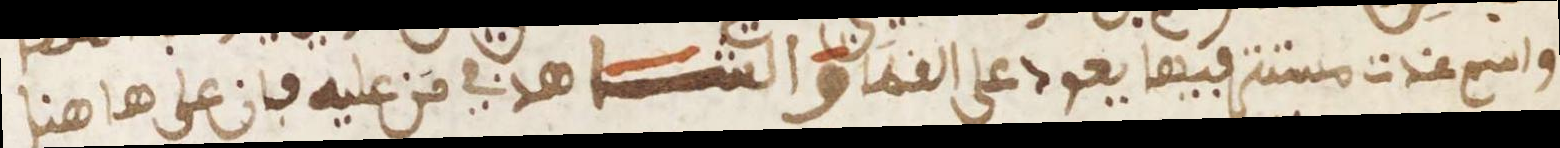واسم غدت مستتر فيها يعود على القطا و الشاهد في من عليه فان على ها هنا
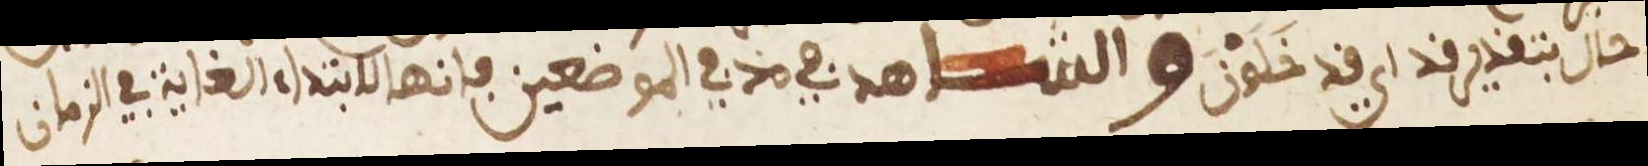حال بتقدير قد اي قد خلون و الشاهد في مذ في الموضعين فانها لابتداء الغاية في الزمان
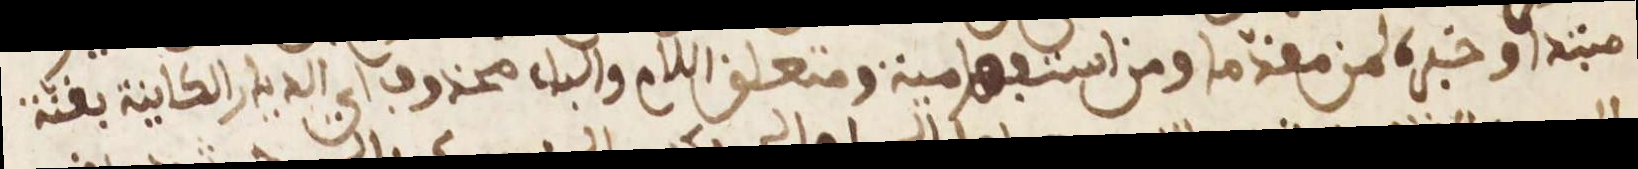مبتدا و خبره لمن مقدما و من استفهامية و متعلق اللام و الباء محذوف اي الديار الكاينة بقنة
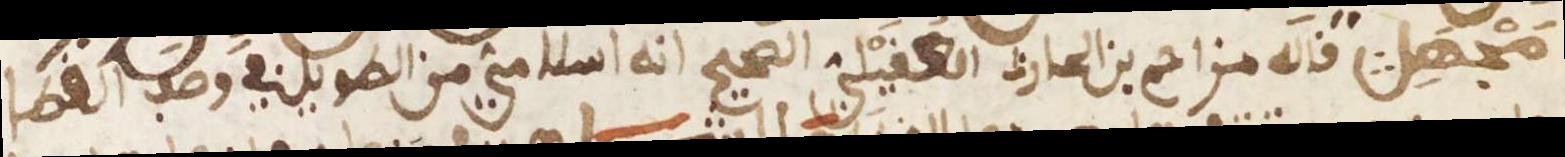مجهل قاله مزاحم بن الحارث العقيلي الصحيح انه اسلامي من الطويل في وصف القطا
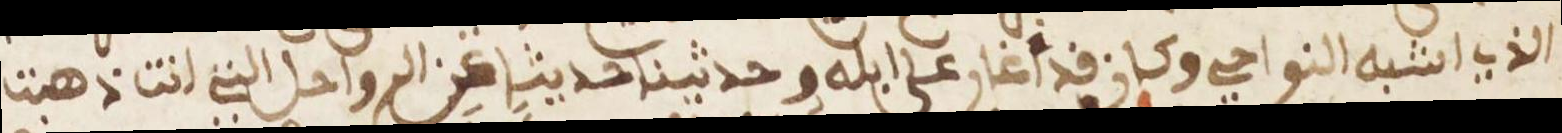الذي اشبه النواحي و كان قد أغار على ابله و حدثينا حديثا عن الرواحل التي انت ذهبت
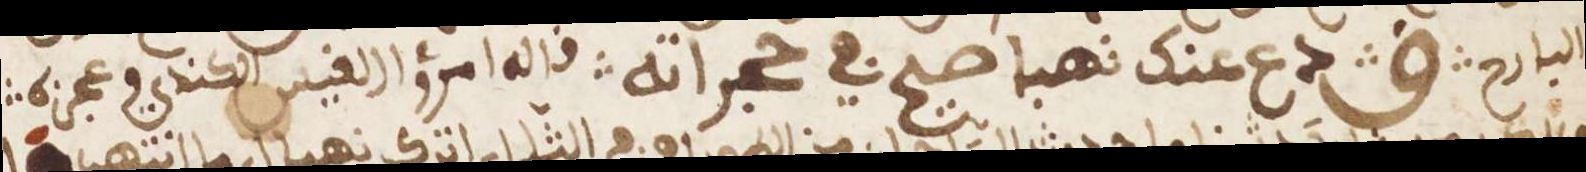البارح ق دع عنك نهبا صيح في حجراته قاله امرؤ القيس الكندي و عجزه
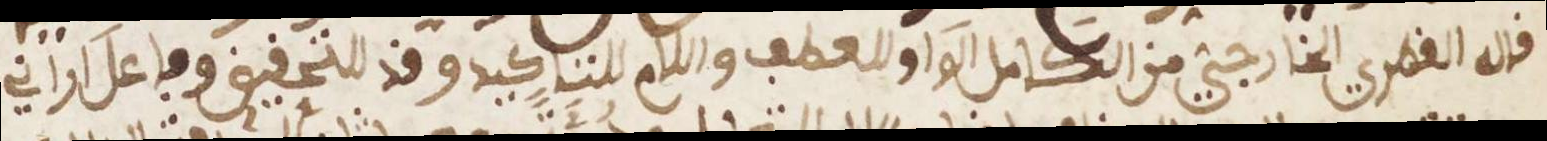قاله القطري الخارجي من الكامل الواو للعطف و اللام للتاكيد و قد للتحقيق و فاعل اراني
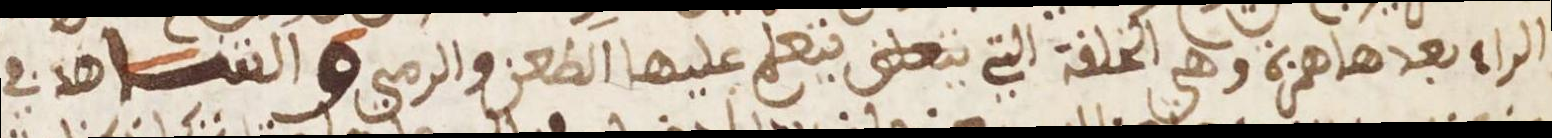الراء بعدها همزة و هي الخلقة التي يتعلم عليها الطعن و الرمي و الشاهد في
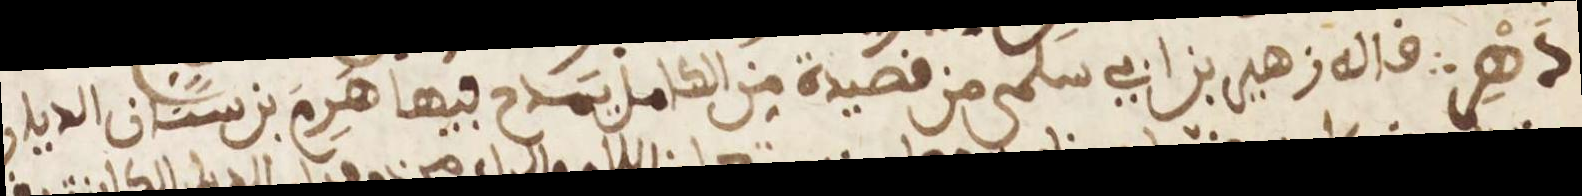دهر قاله زهير بن ابي سلمى من قصيدة من الكامل يمدح فيها هرم بن سنان الديار
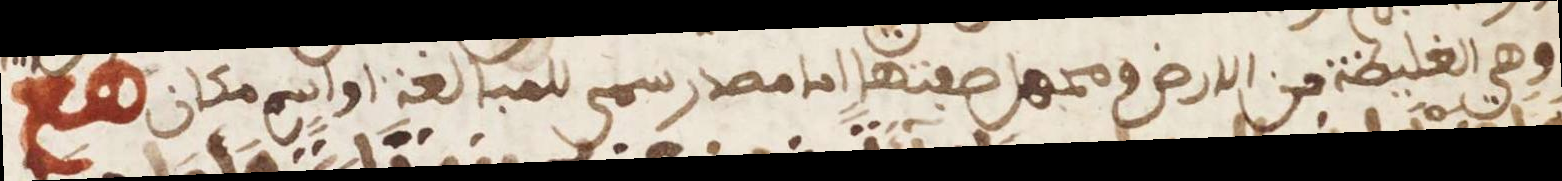و هي الغليظة من الارض و مجهل صفتها اما مصدر سمى للمبالغة او اسم مكان هع
